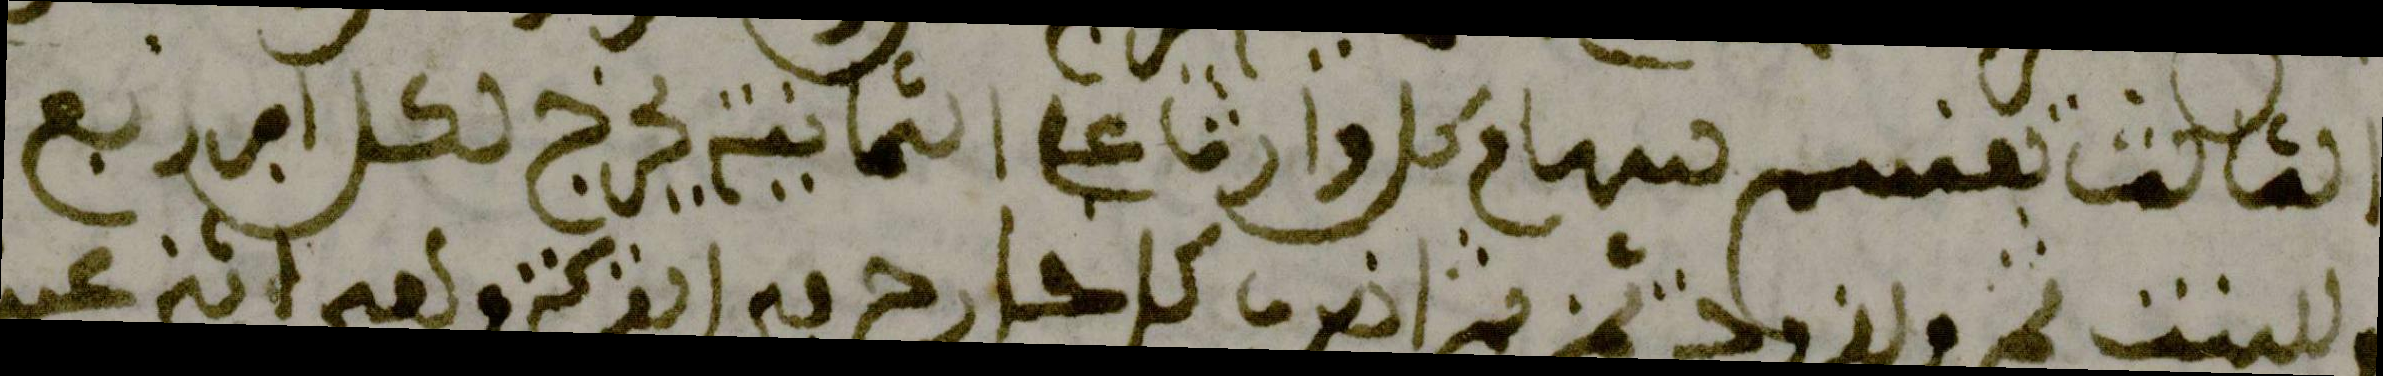الثالث تقسم سهام كل وارث على الثمانية يخرج لكل ابن ربع
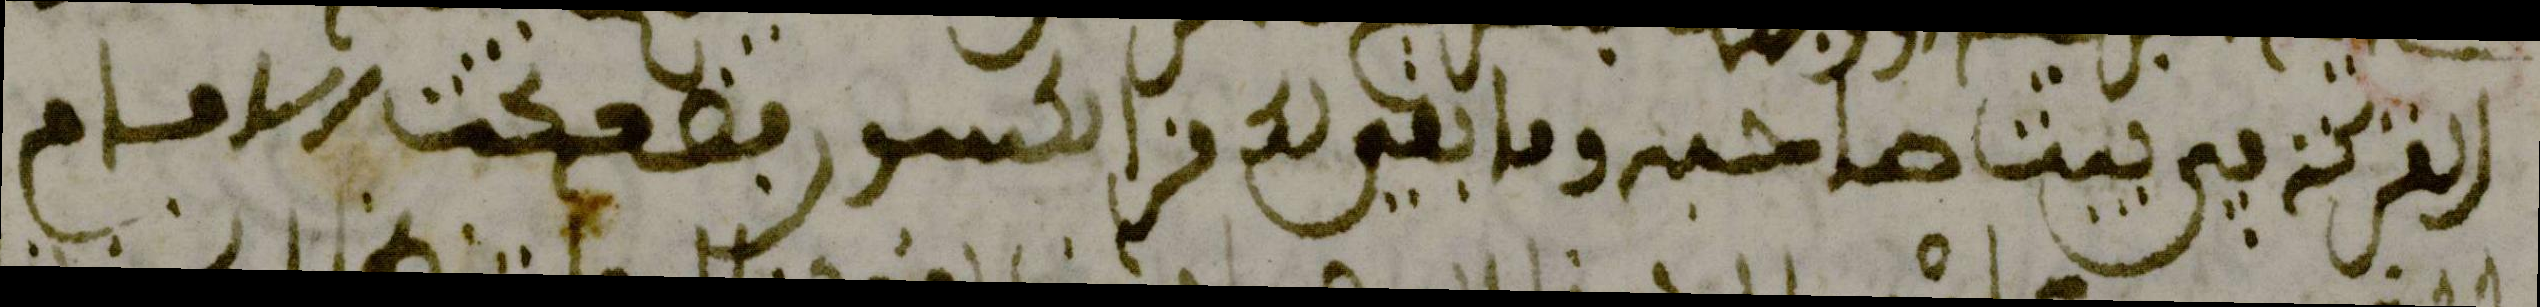التركة في بيت صاحبه وما بقي لك من الكسور فضعه تحت الامام
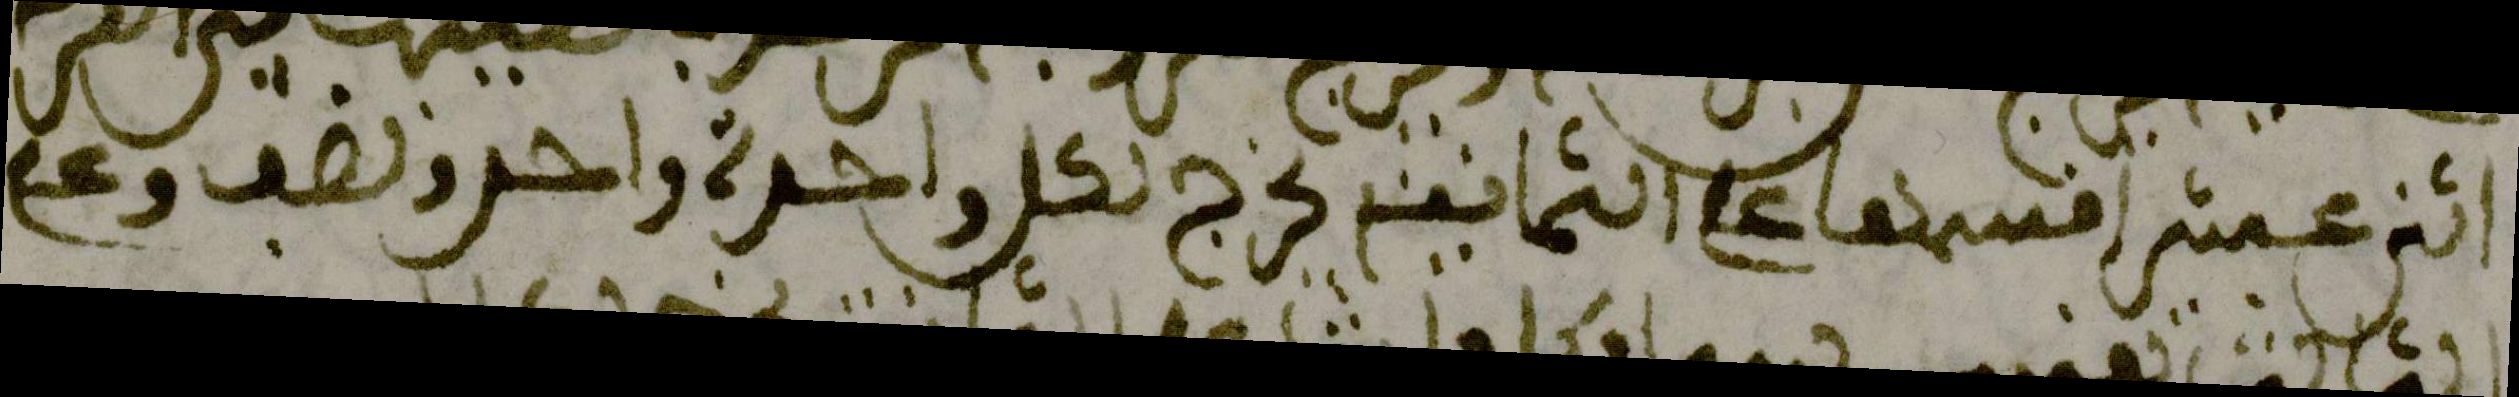اثنى عشر اقسمها على الثمانية يخرج واحدة واجحد ونصف وعلى
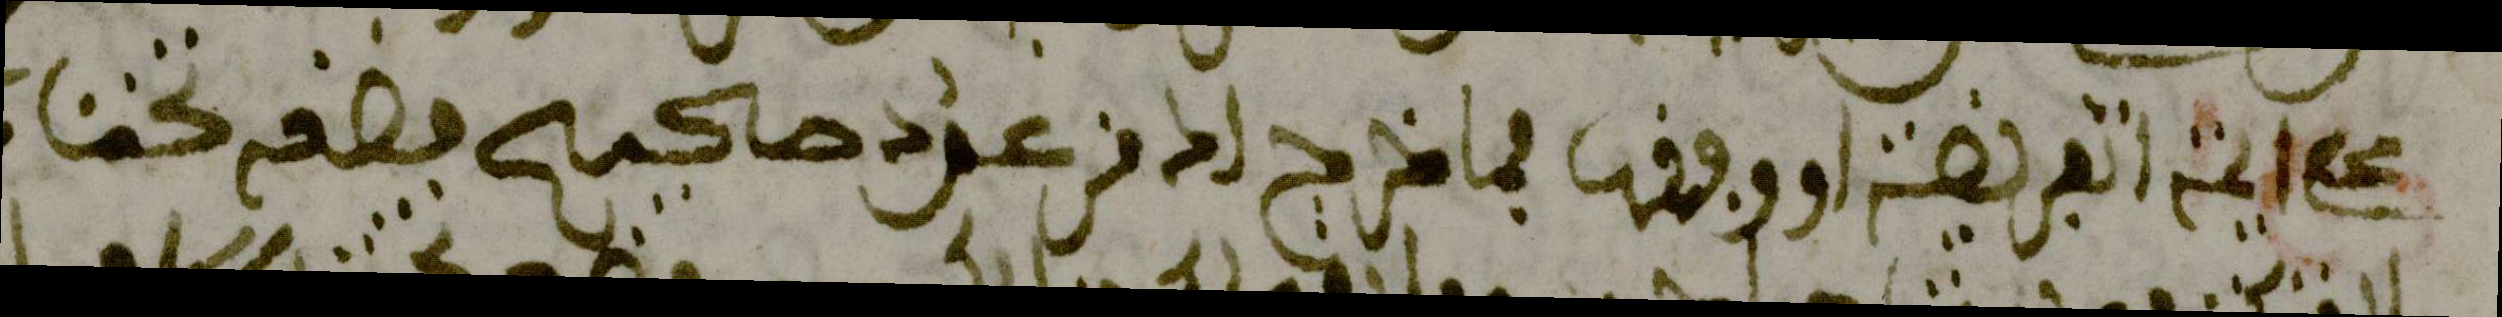على ايمة الفريضة او وفقها فما خرج لك من عدد صحيح فضعه تحت
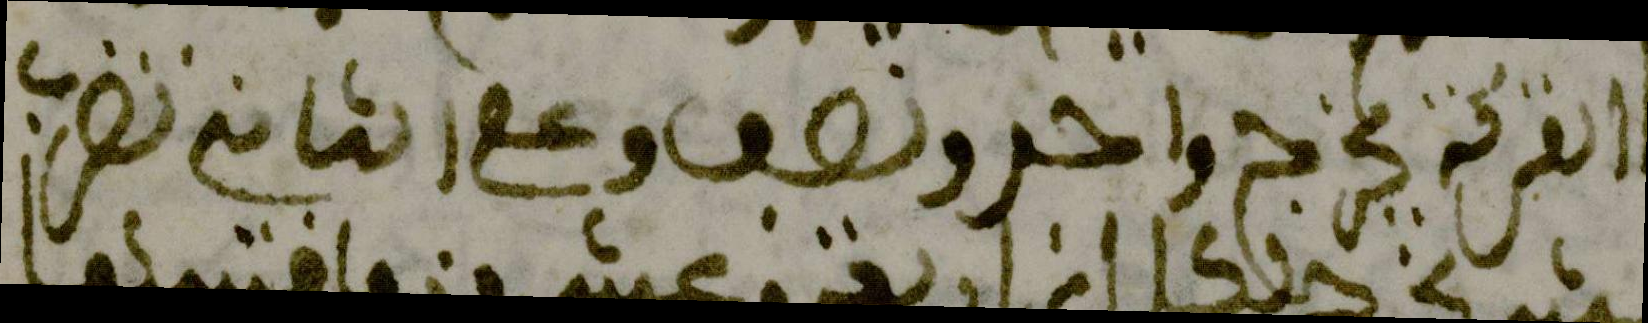التركة يخرج واحد ونصف وعلى الثاني تضرب
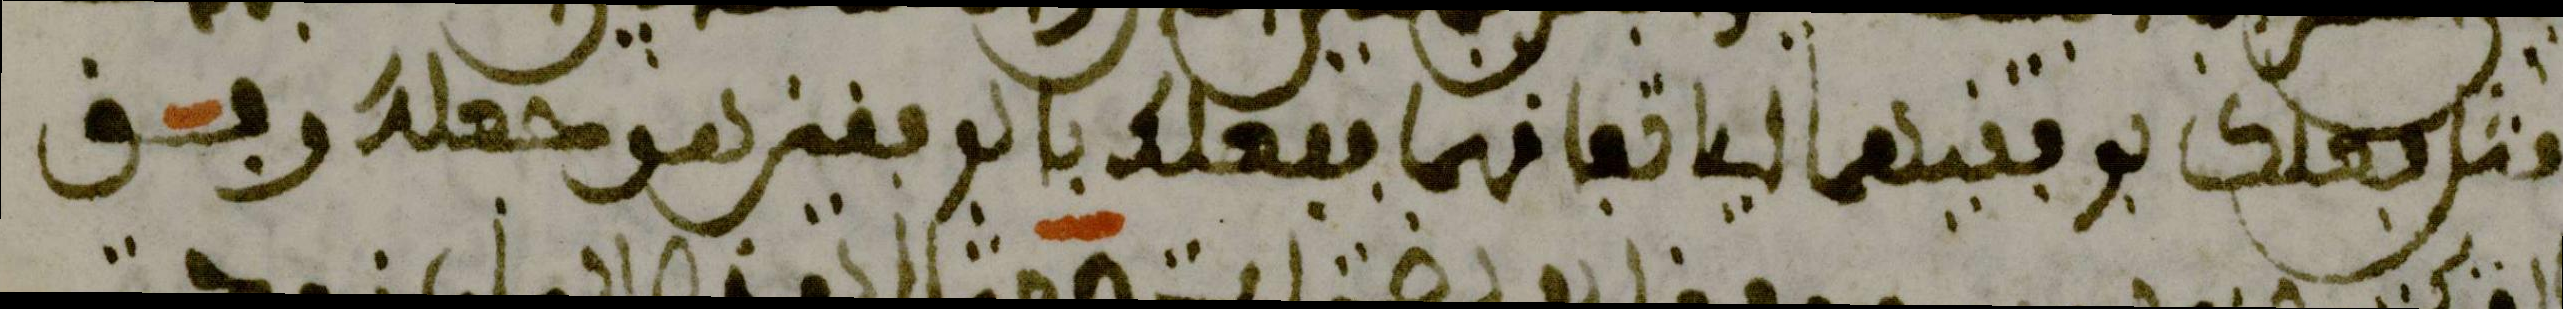مثل فعلك بوفقيهما اي اتفاقهما ففعلك بالوفقين هو جعلك وفَق
